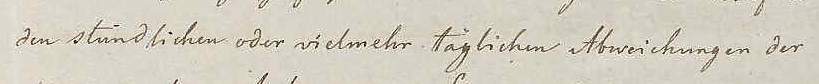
den stündlichen oder vielmehr täglichen Abweichungen der
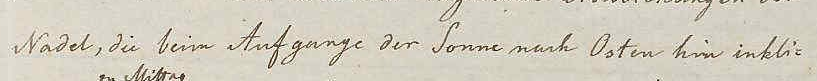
Nadel, die beim Aufgange der Sonne nach Osten hin inkli-
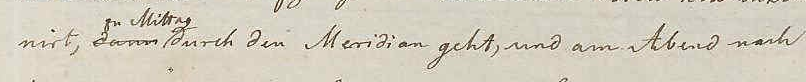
nirt, dannzu Mittag durch den Meridian geht, und am Abend nach
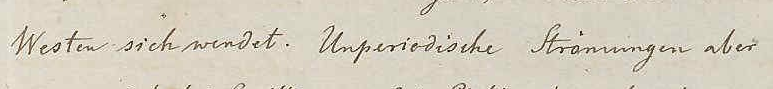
Westen sich wendet. Unperiodische Strömungen aber
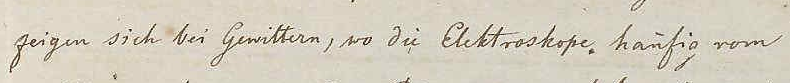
zeigen sich bei Gewittern, wo die Elektroskope häufig vom
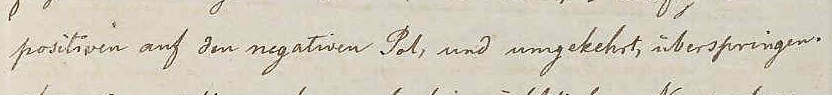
positiven auf den negativen Pol, und umgekehrt, überspringen.
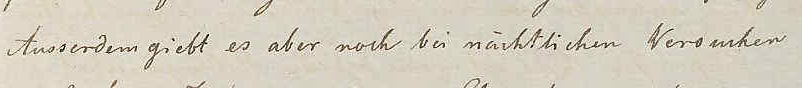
Ausserdem giebt es aber noch bei nächtlichen Versuchen
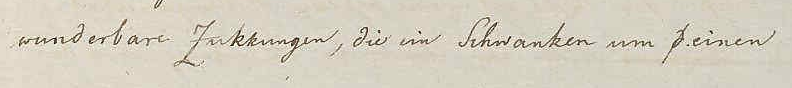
wunderbare Zukkungen, die ein Schwanken um d.einen
